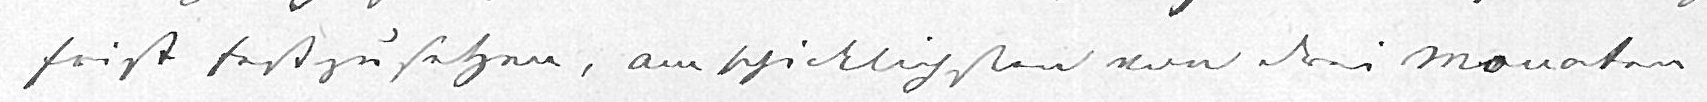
frist festzusetzen, am schicklichsten von drei Monaten.
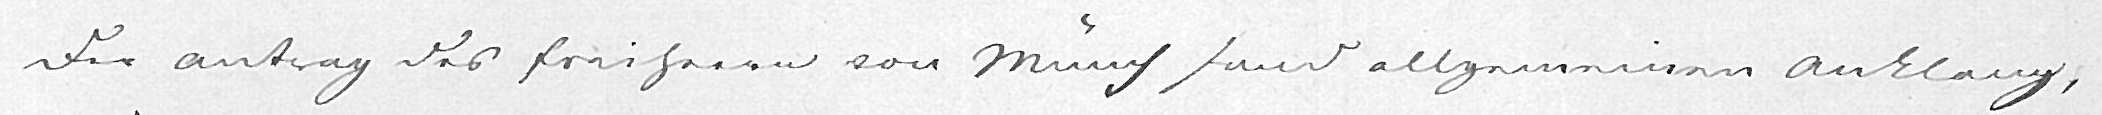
Der Antrag des Freiherrn von Münch fand allgemeinen Anklag,
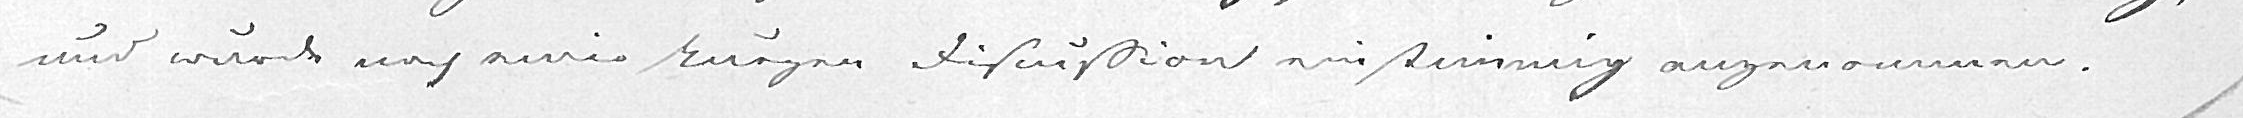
und wurde nach einer kurzen Discussion einstimmig angenommen.
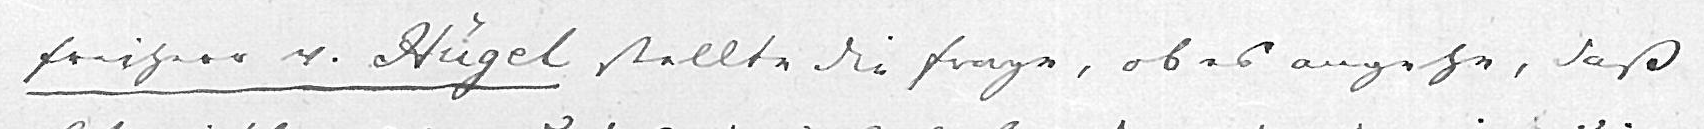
Freiherr v. Hügel stellte die Frage, ob es angehe, daß
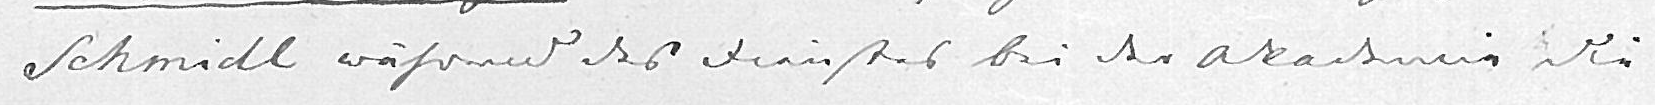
Schmidl während des Dienstes bei der Akademie die
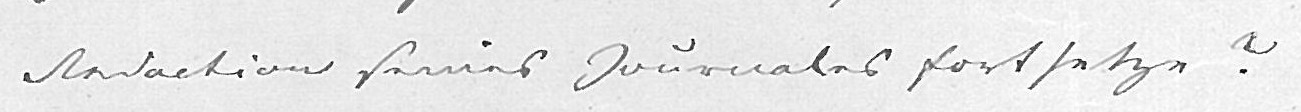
Redaction seines Journals fortsetze?
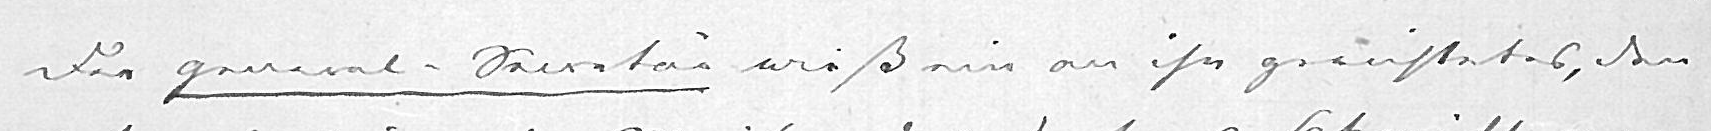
Der General-Secretär wieß ein an ihn gerichtetes, den
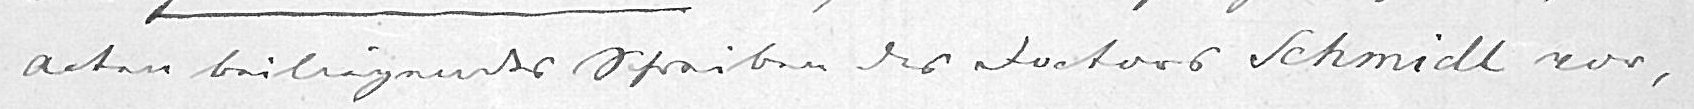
Acten beiliegendes Schreiben des Doctors Schmidl vor,
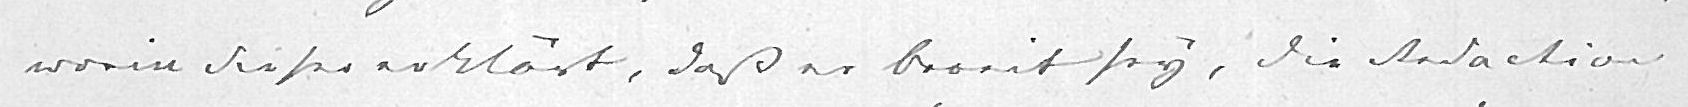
worin dieser erklärte, daß er bereit sey, die Redaction
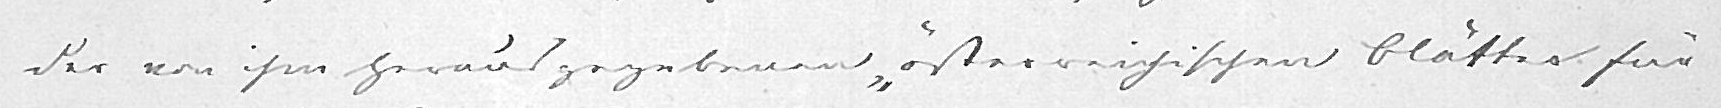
der von ihm herausgegebenen "österreichischen Blätter für
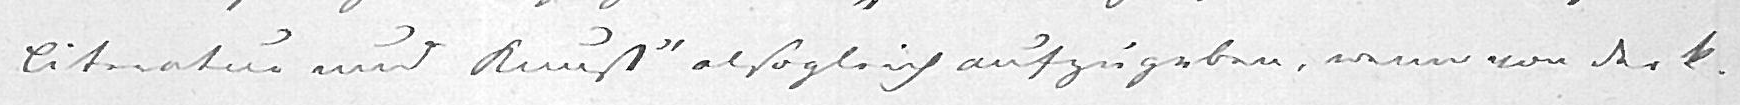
Literatur und Kunst" alsogleich aufzugeben, wenn von der k.
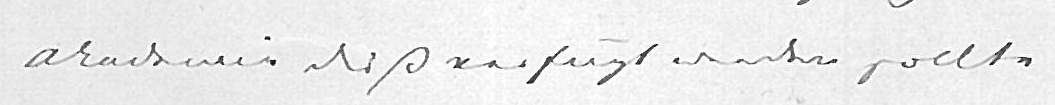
Akademie dieß verfügt werden sollte.
